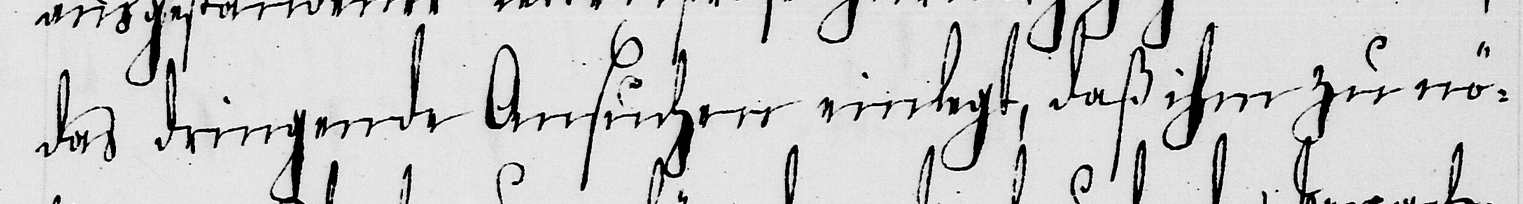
das dringende Ansuchen einlegt, daß ihm zu nö¬
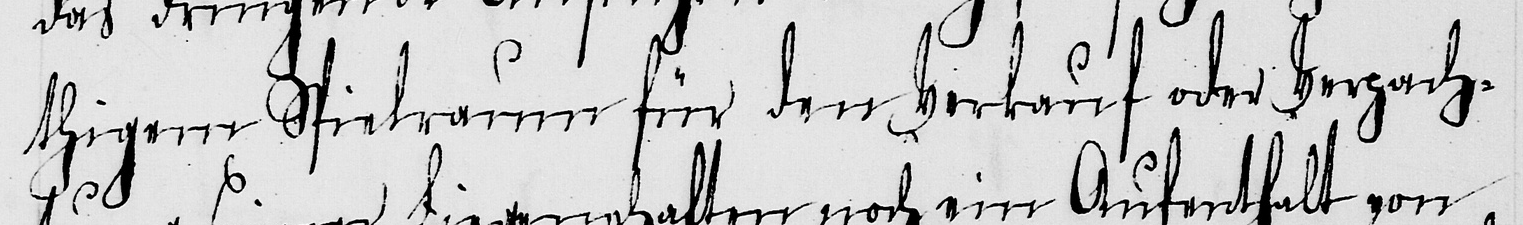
thigem Spielraum für den Verkauf oder Verpach¬
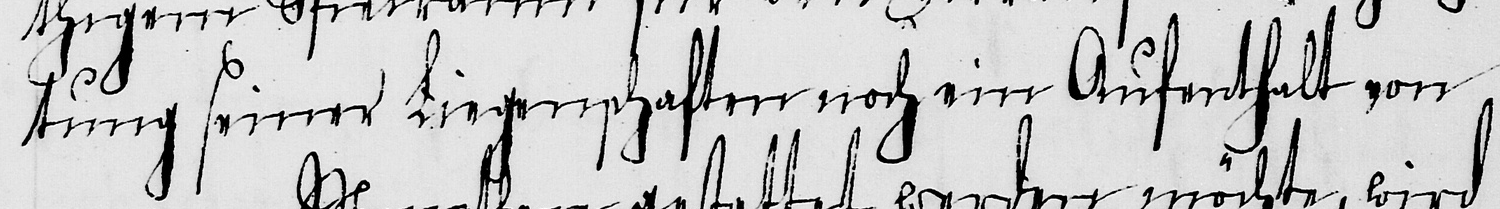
tung seiner Liegenschaften noch ein Aufenthalt von
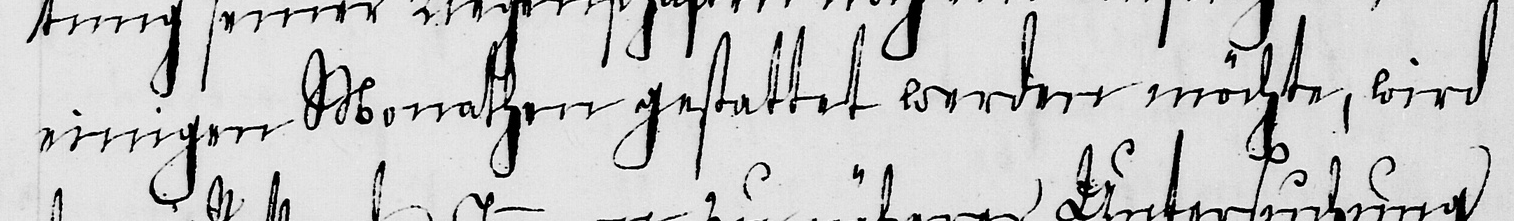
einigen Monathen gestattet werden möchte, wird
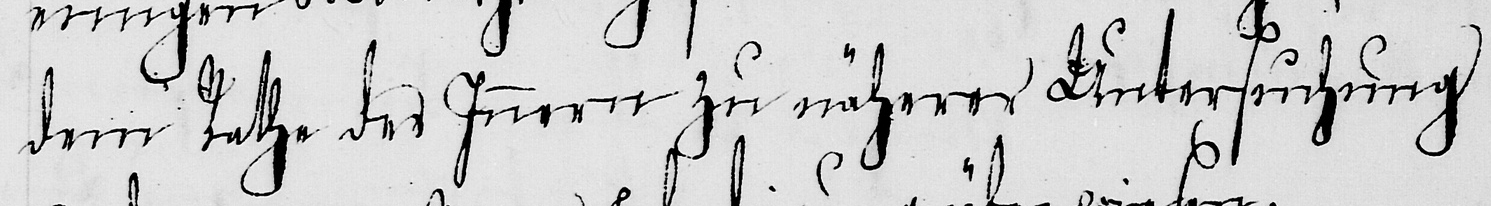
dem Rathe des Innern zu näherer Untersuchung
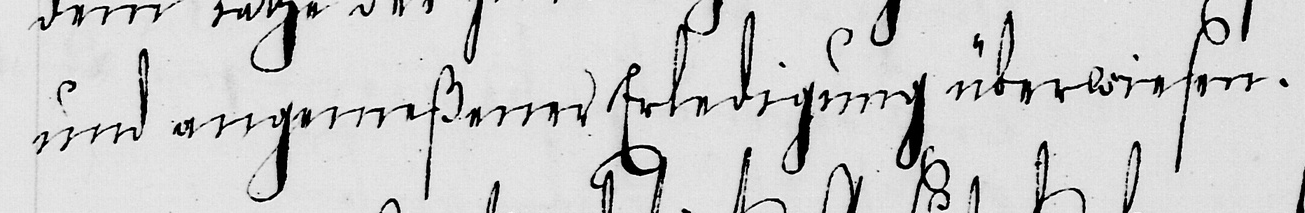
und angemeßener Erledigung überwiesen.
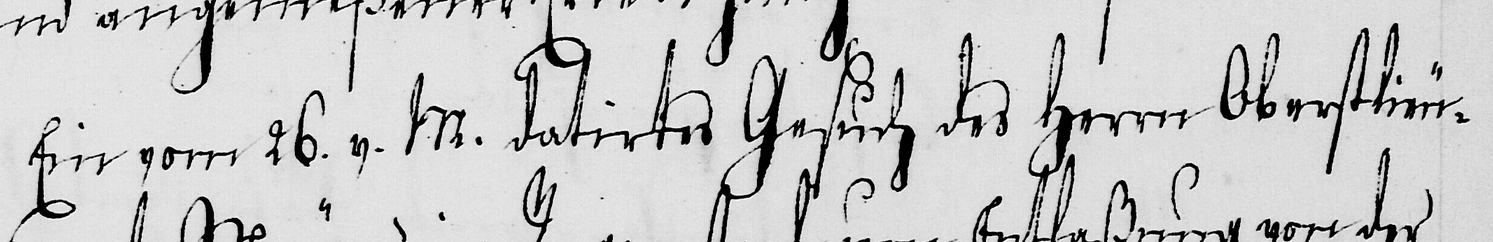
Ein vom 26. v. M. datirtes Gesuch des Herrn Oberstlieu¬
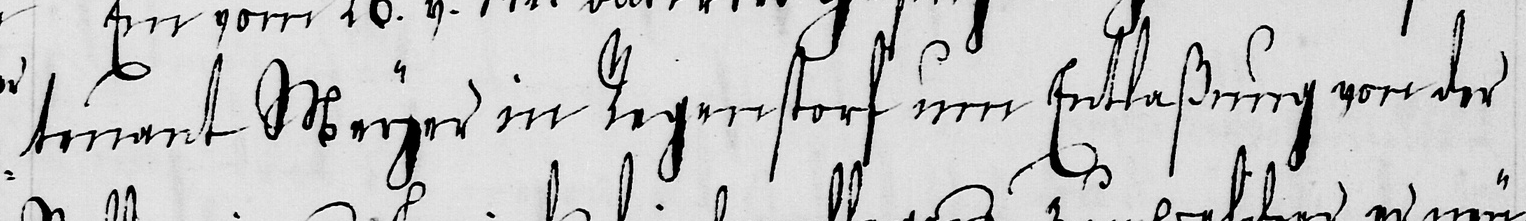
tenant Meyer in Regenstorf um Entlaßung von der
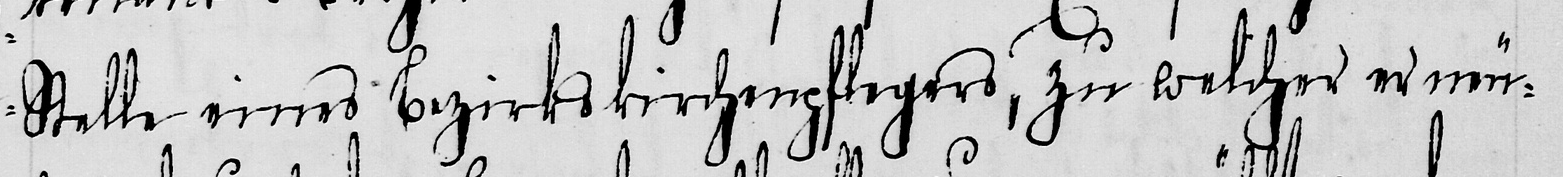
Stelle eines Bezirkskirchenpflegers, zu welcher er neu¬
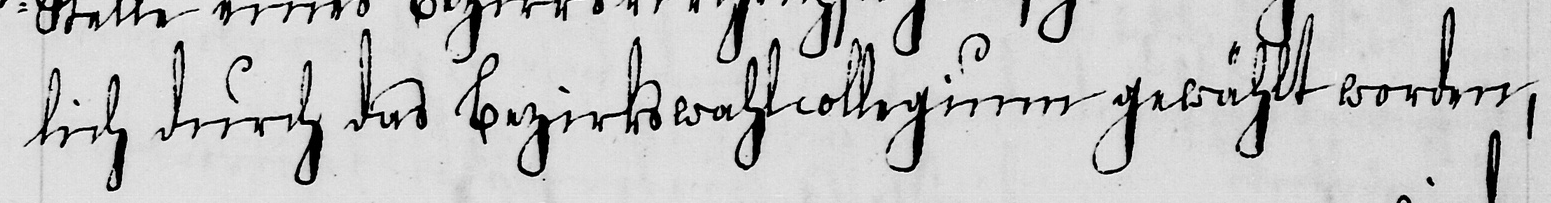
lich durch das Bezirkscollegium gewählt worden,
